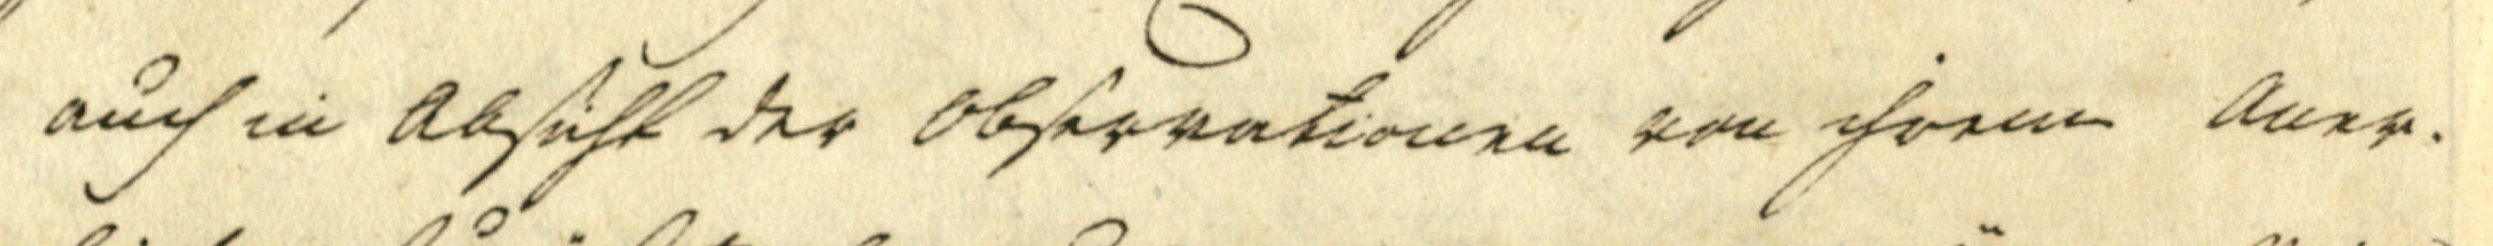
auch in Absicht der Observationen von ihrem Aner¬
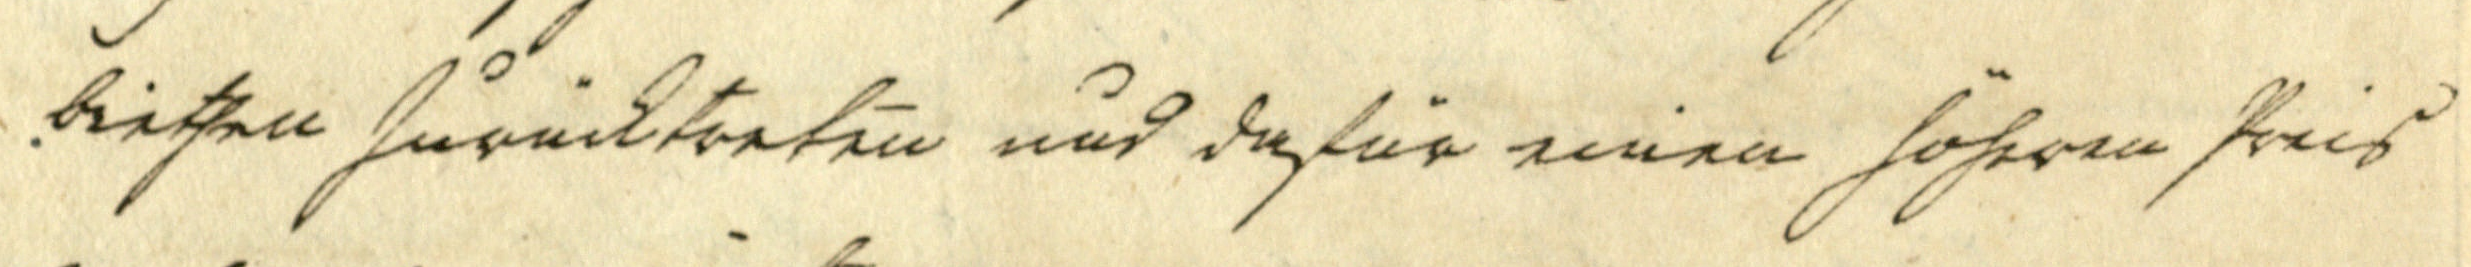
biethen zurücktreten und dafür einen höheren Preis
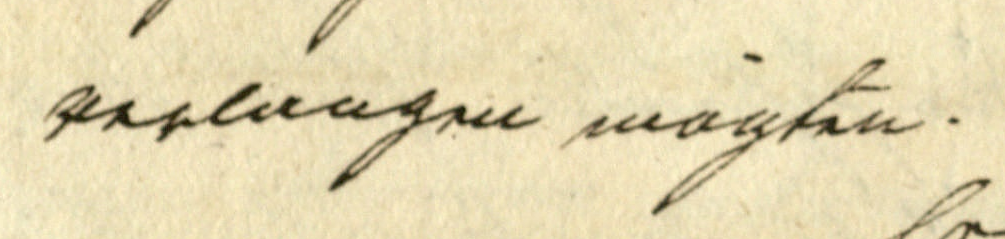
verlangen mögten.
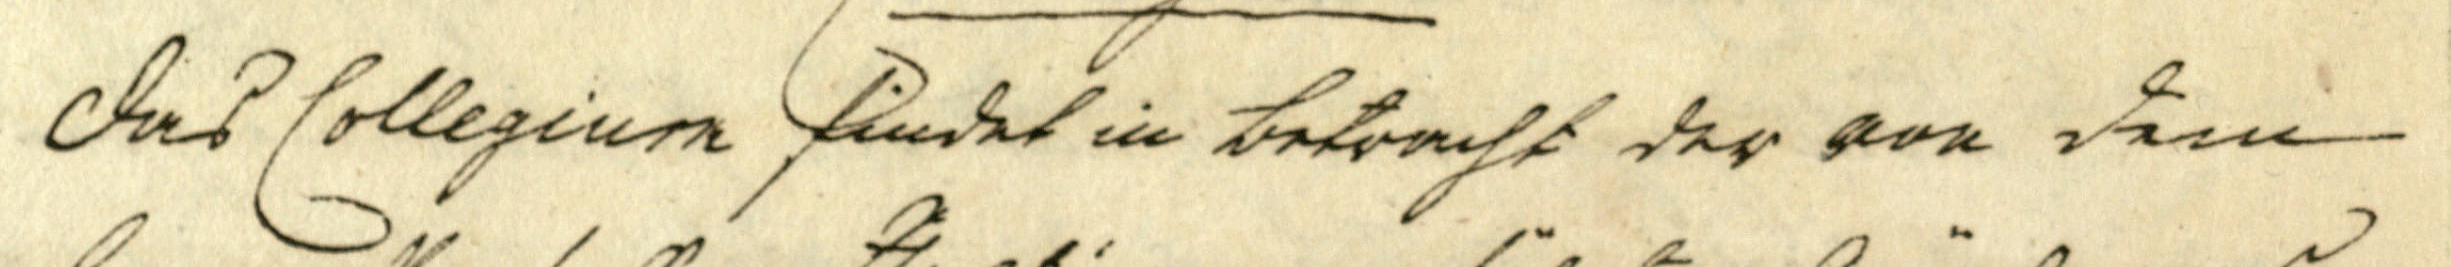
Das Collegium findet in Betracht der von dem
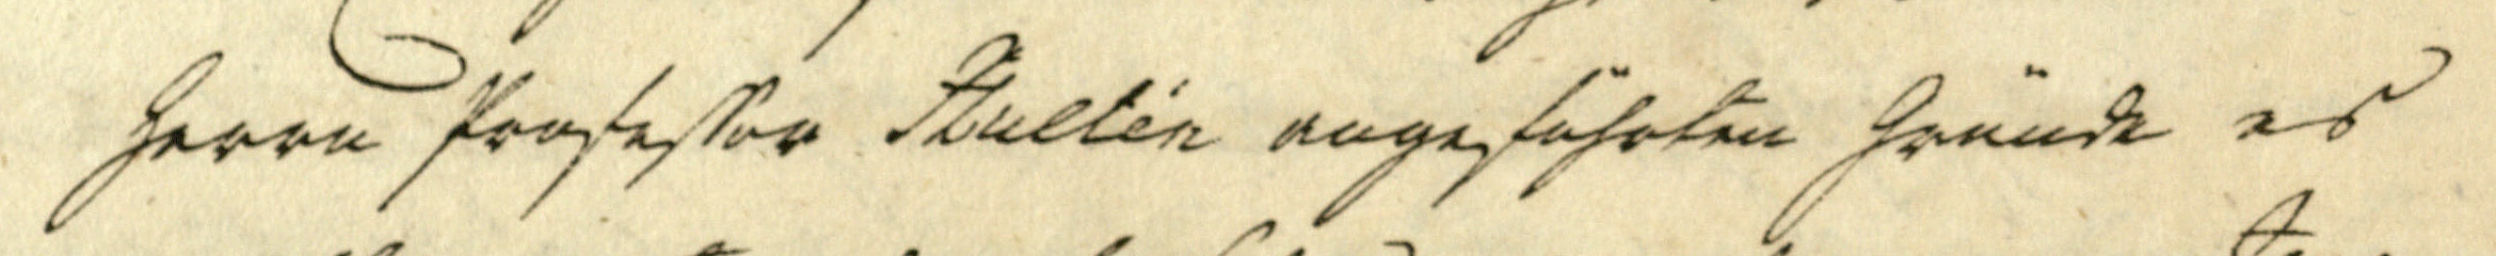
Herrn Professor Hultén angeführten Gründe es
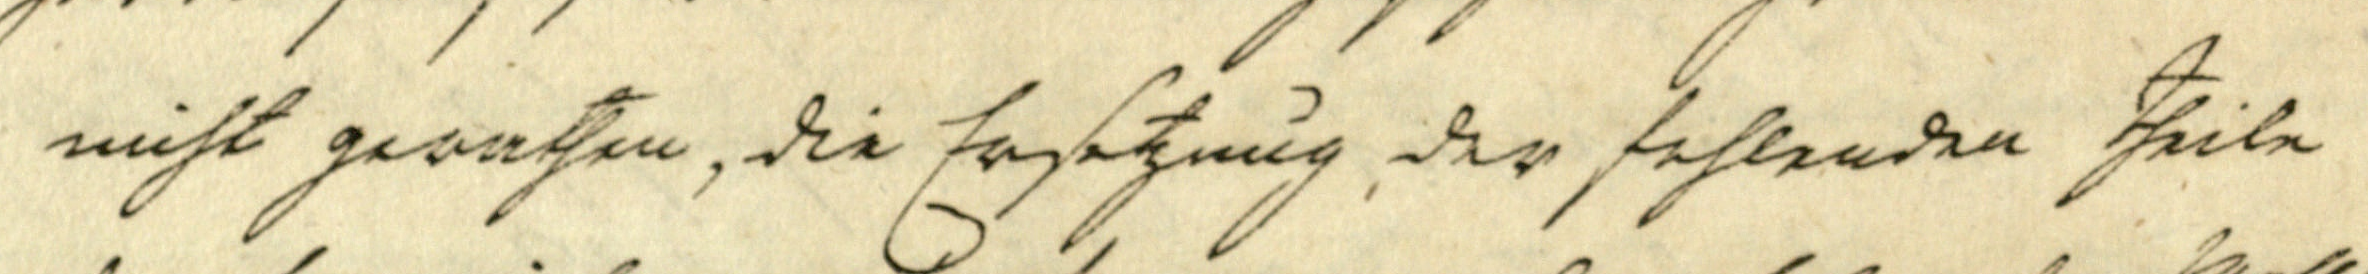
nicht gerathen, die Ersetzung der fehlenden Theile
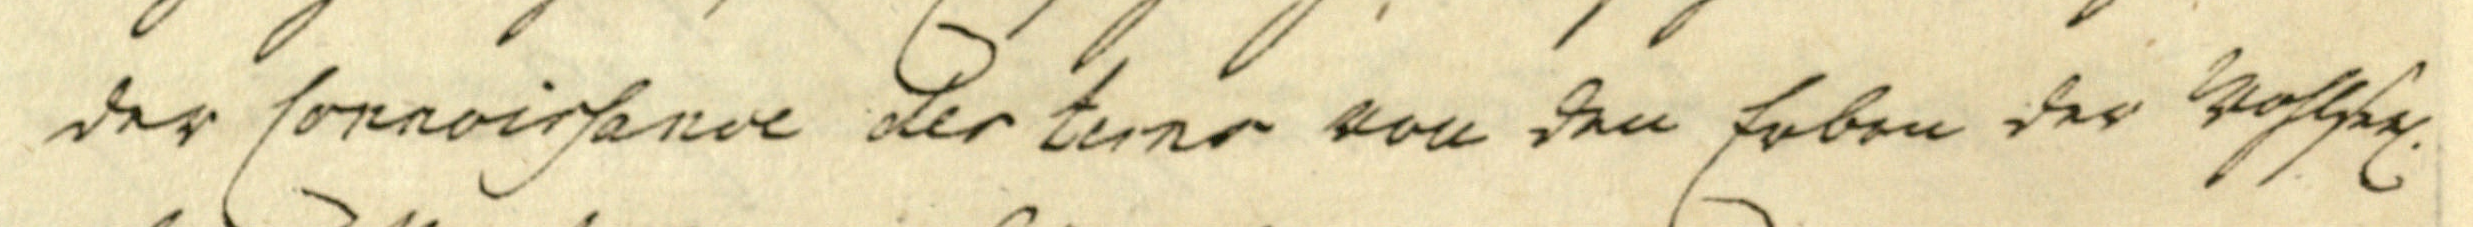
der Connvissance des terns von den Erben der Wohlseel.
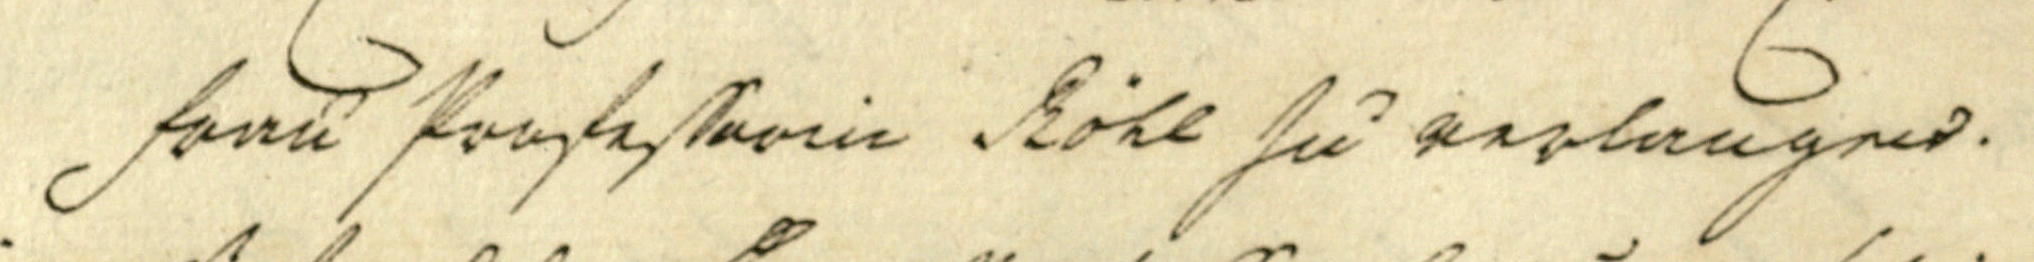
Frau Professorin Röhl zu verlangen.
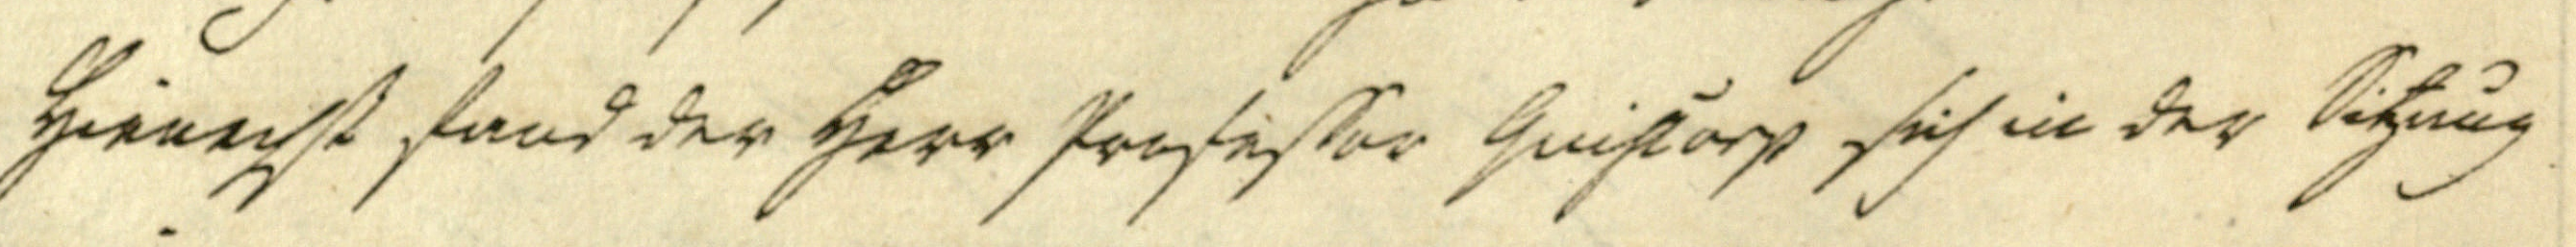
Hienechst fand der Herr Professor Quistorp sich in der Sitzung
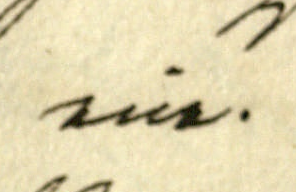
ein.
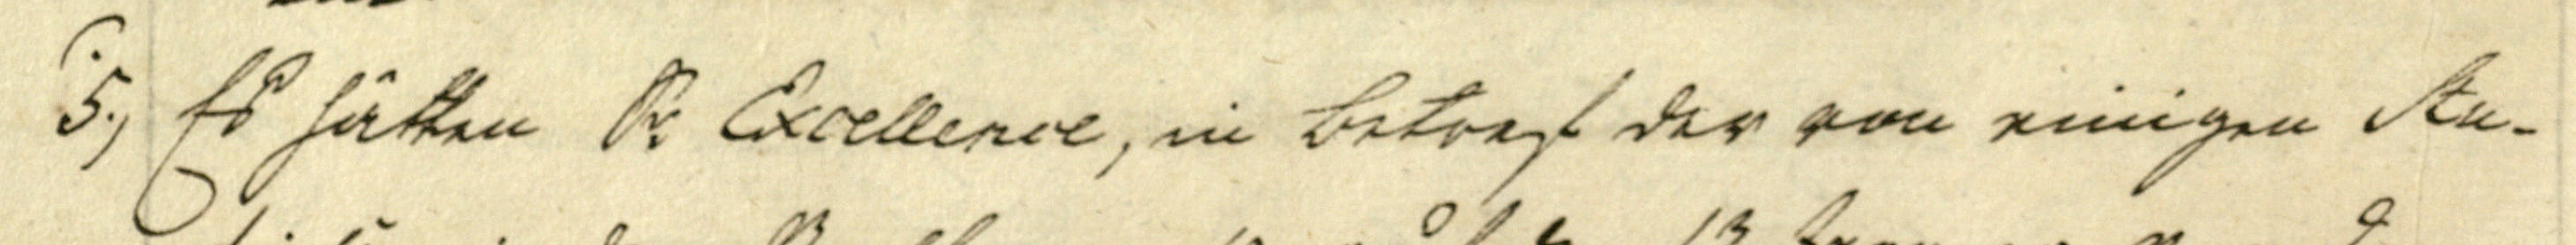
5., Es hätten Sr Excellence, in Betref der von einigen Stu¬
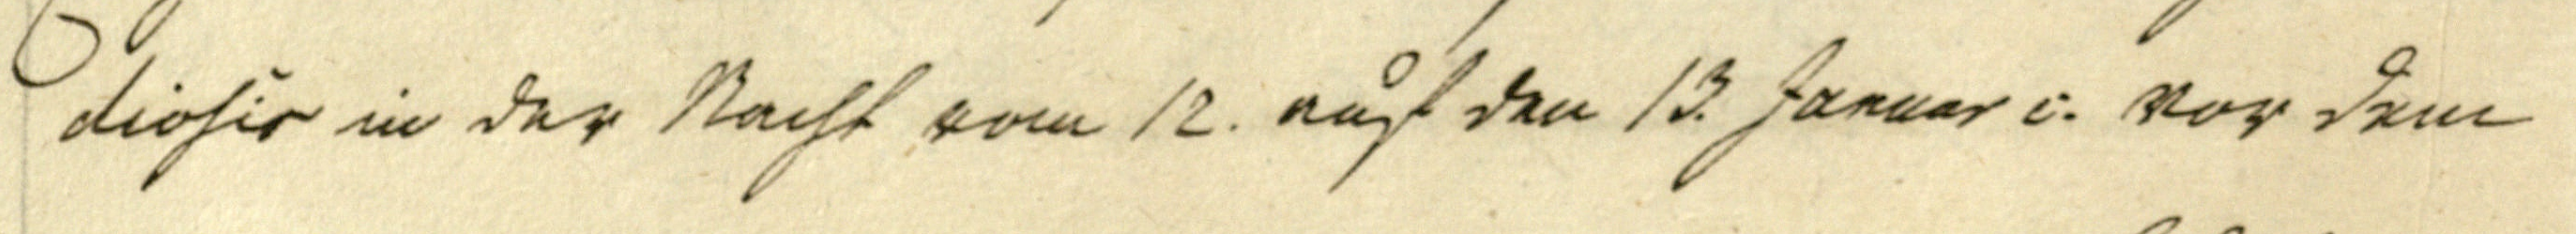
diosis in der Nacht vom 12. auf den 13. Januar c. vor dem
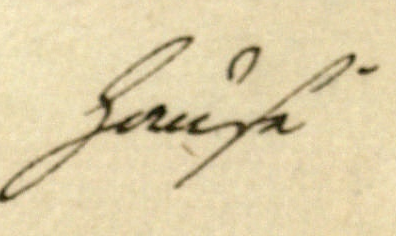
Hause
